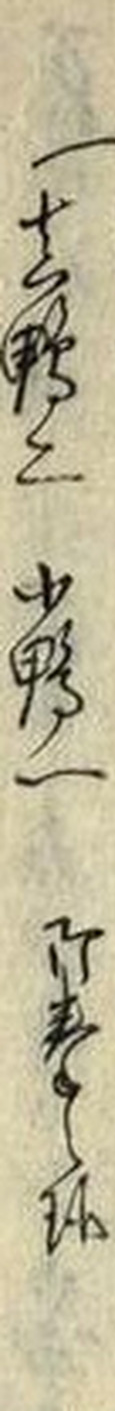真鴨二小鴨一御拳之趣
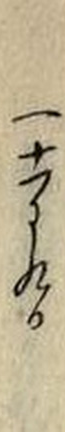一十一月九日
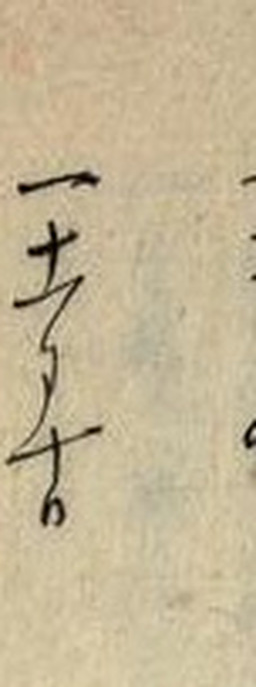一十一月十日
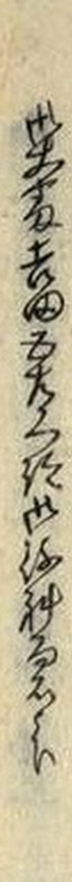御使番吉田五左衛門跡御役料百石被下

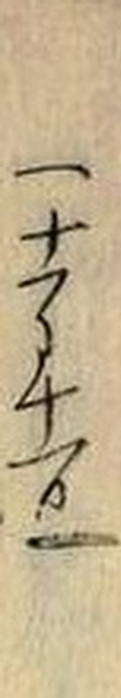一十一月十二日
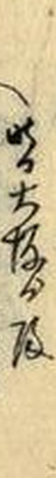昨日大坂ゟ帰
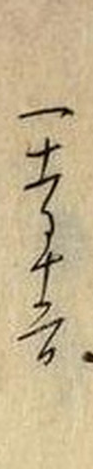一十一月十二日
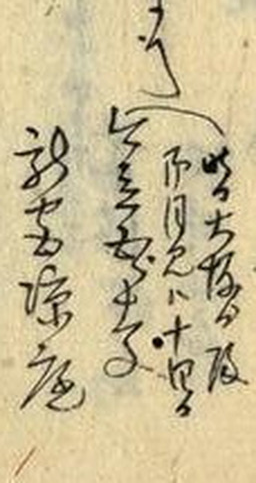今立五郎太夫
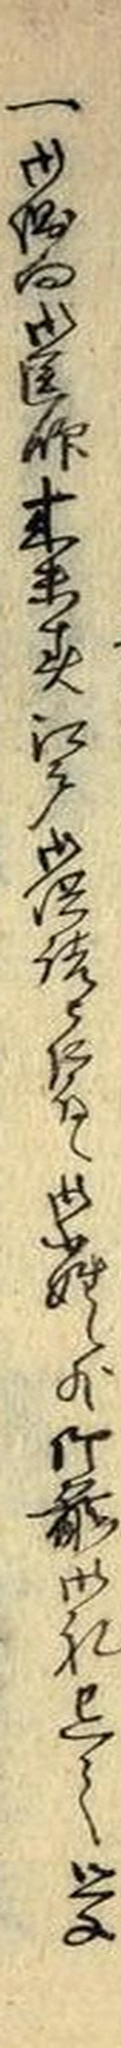一御側向御医師来未春江戸御供詰被仰付候御小姓之外御前御礼申上之且又
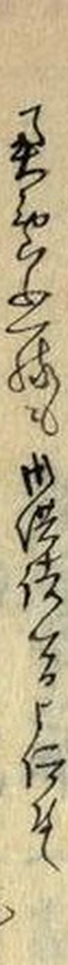奥台子一統も御供詰今日被仰付候
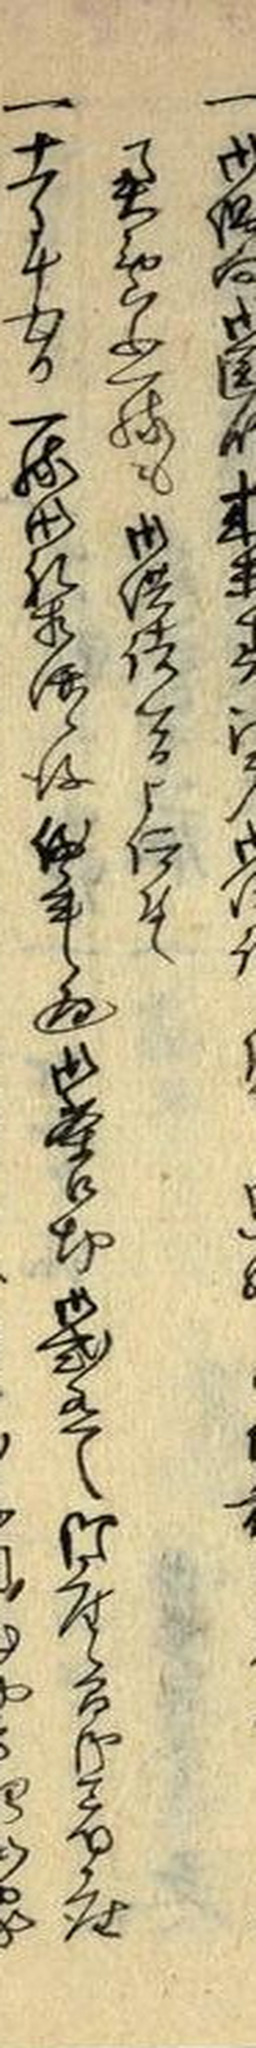一十一月十五日一統御礼相済候後例年之通御茶口切御式有之御座之間御着座
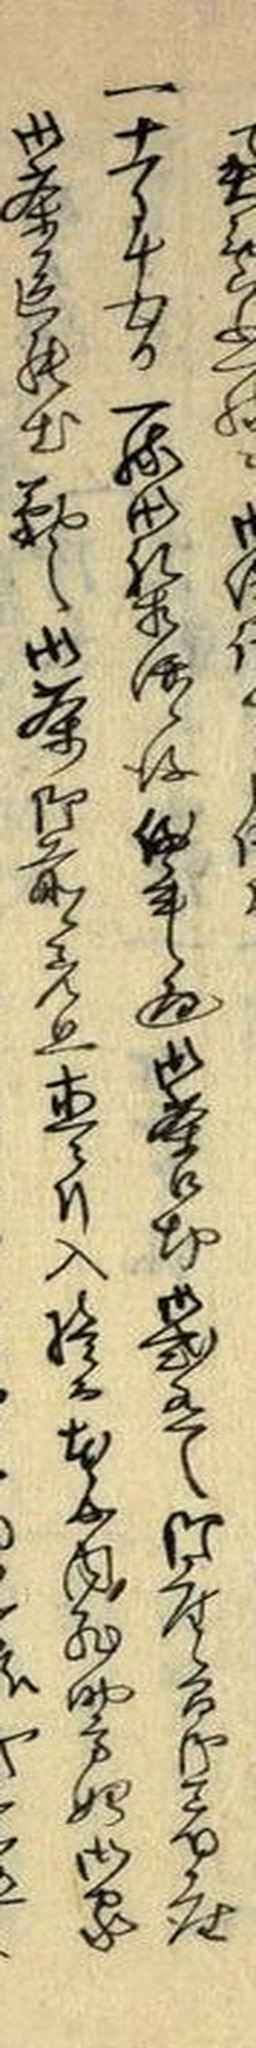御茶道罷出勤之御茶御前へ差上直ニ引入続而本多内蔵助始御家
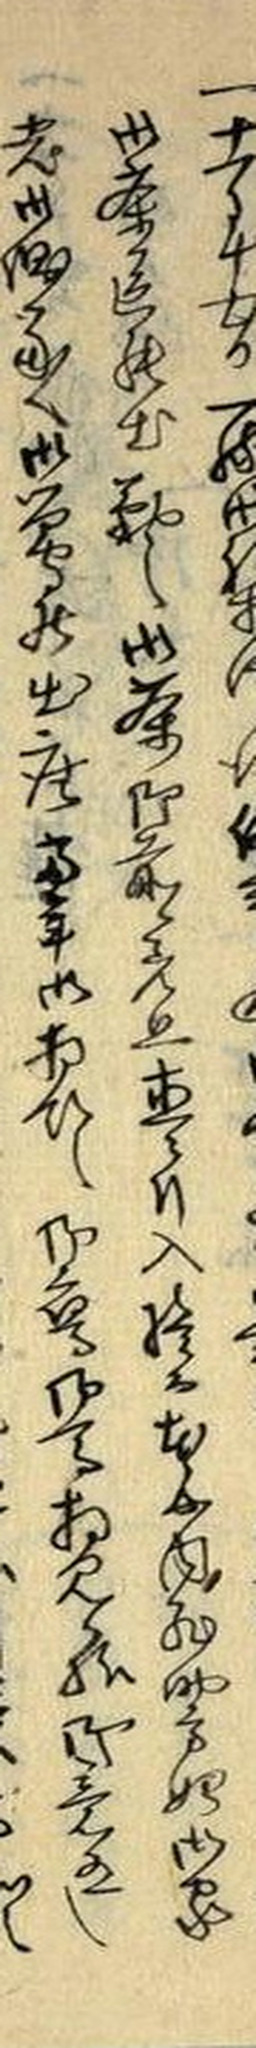老御側御用人御留守居出座当年御拝領之御鷹御馬拝見候様御意有之
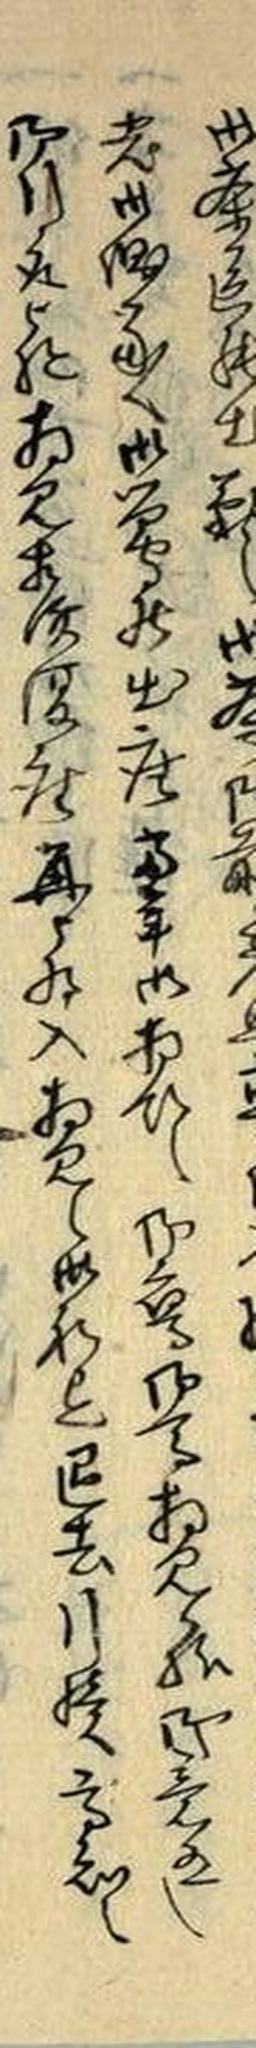御引取被遊拝見相済復座再被為入拝見之御礼申上退去引続高知之
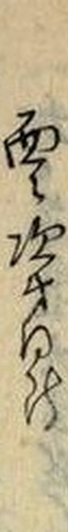面々次第同断
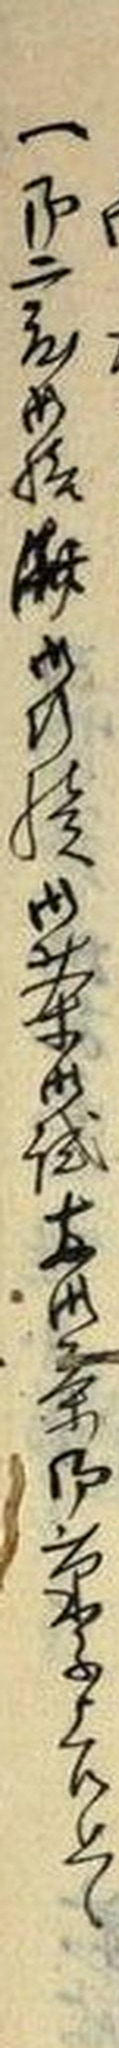一御二度御膳済御引続御茶御試両御茶御菓子被召上候
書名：少傅日録抄（斉承付側向頭取日記、在国）
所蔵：福井県文書館 Fukui Prefectural Archives
